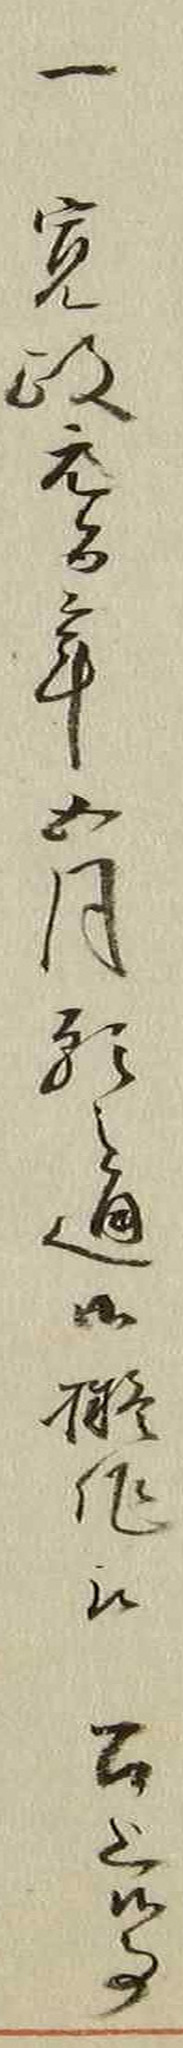一寛政元酉年五月願之通御擬作被召上候事
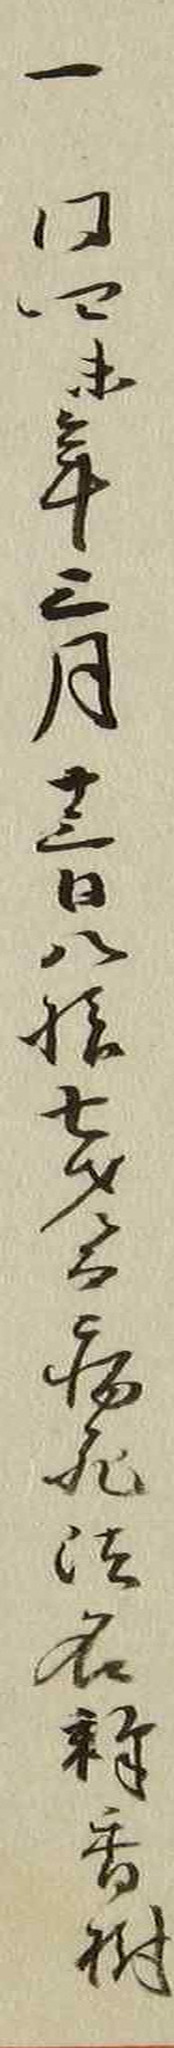一同四未年三月十三日八拾七才ニ而病死法名釈香樹
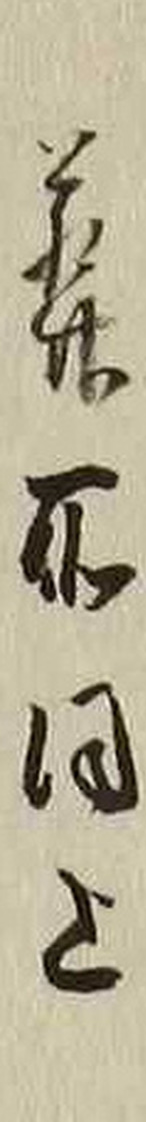葬所同上
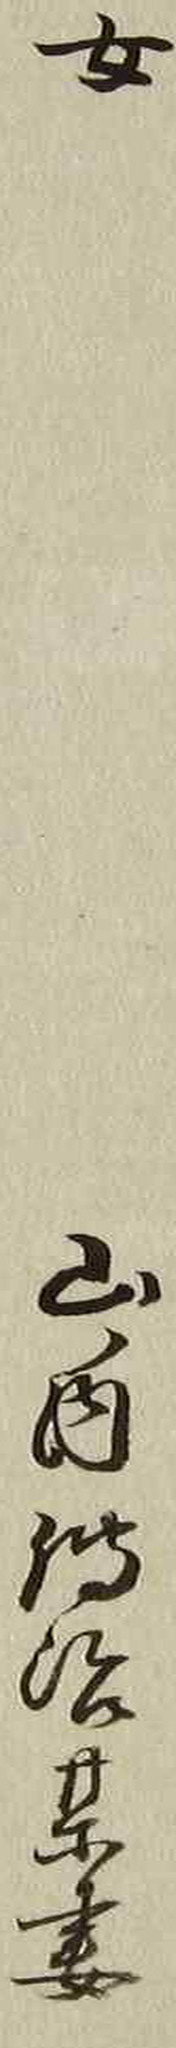女山ノ内伝治某妻
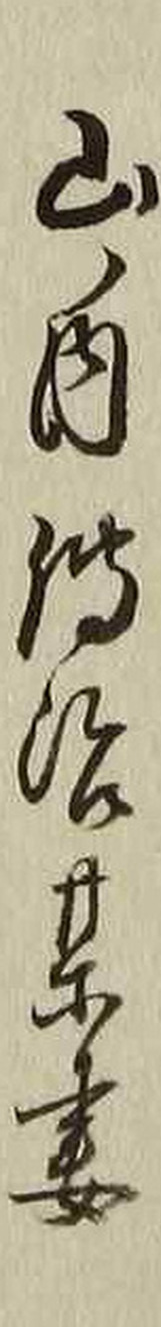女山ノ内伝治某妻
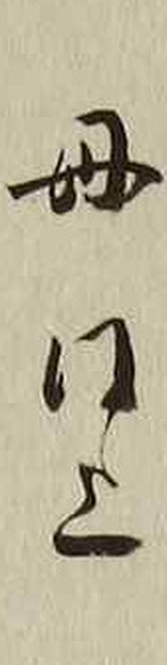母同上
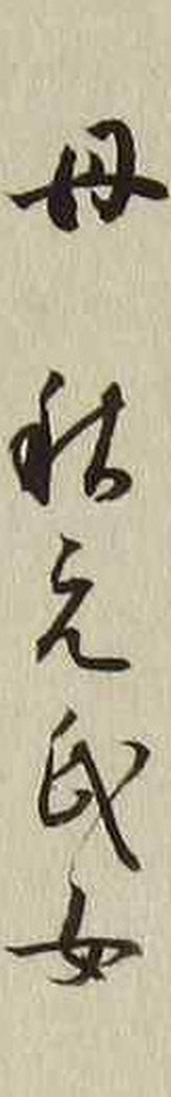母秋元氏女
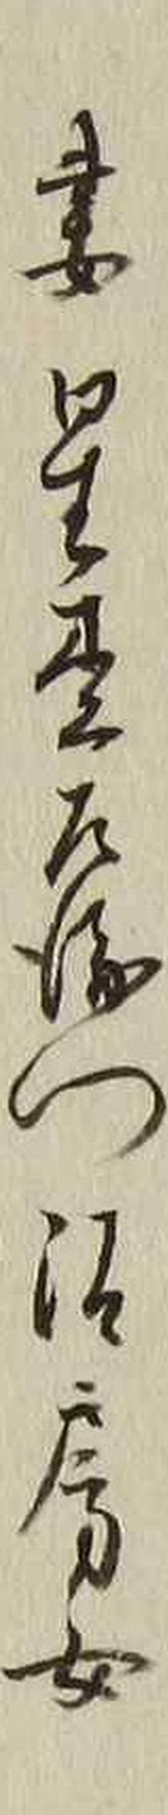妻星杢左衛門清房女
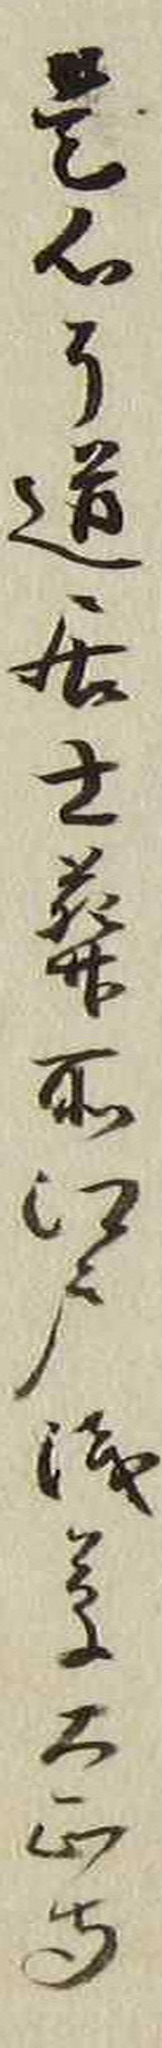是心了道居士葬所江戸浅草大正寺

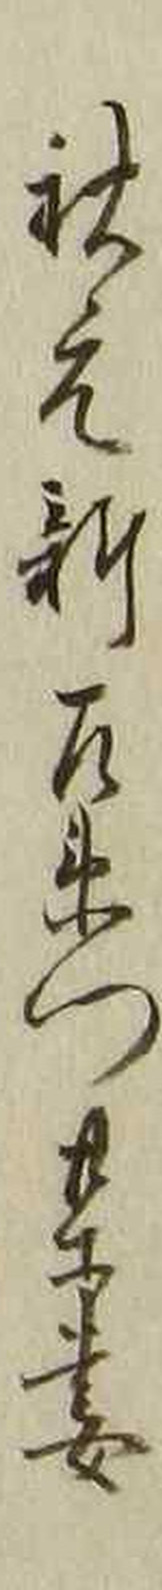女秋元新左衛門某妻
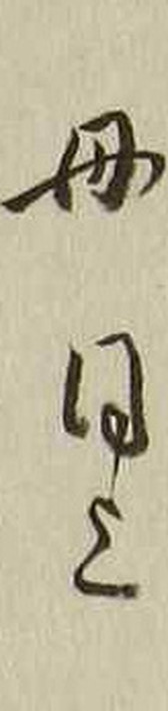母同上
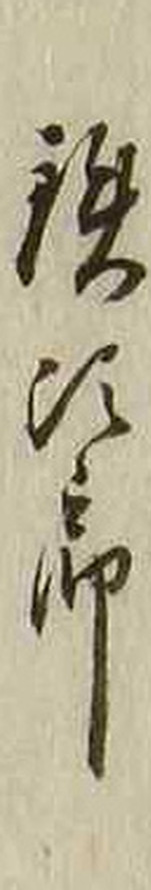鉄次郎
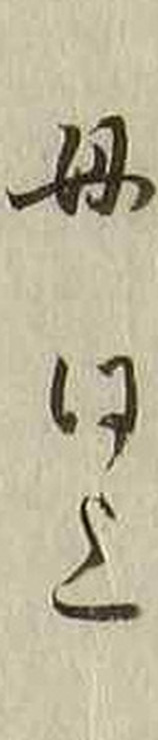母同上
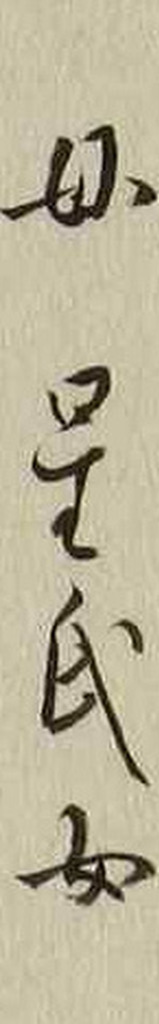母星氏女
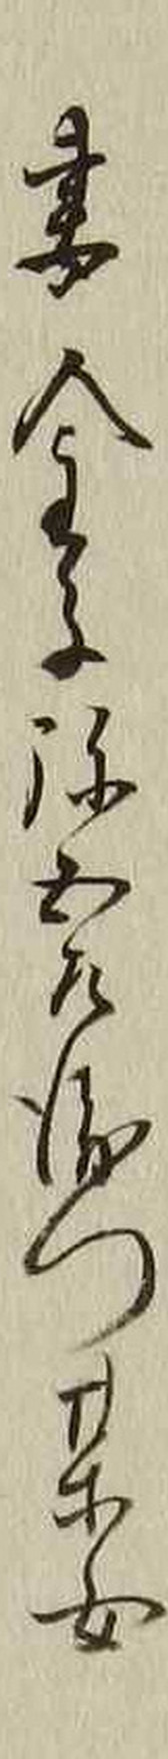妻金子弥五左衛門某女
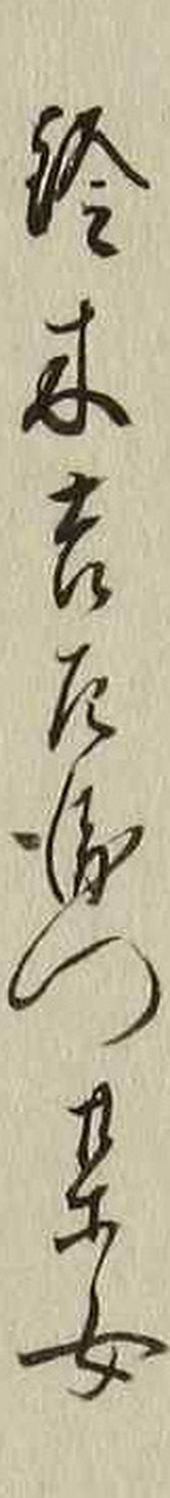鈴木吉左衛門某女
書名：諸士系譜　巻之32　い之部32
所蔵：会津若松市立会津図書館
